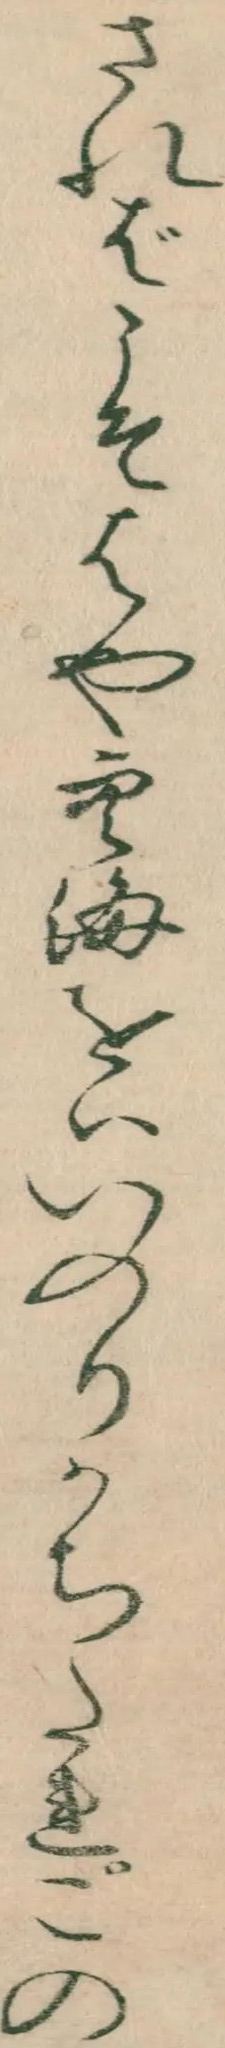さればこそはや空海をはいのりうちたれ。この
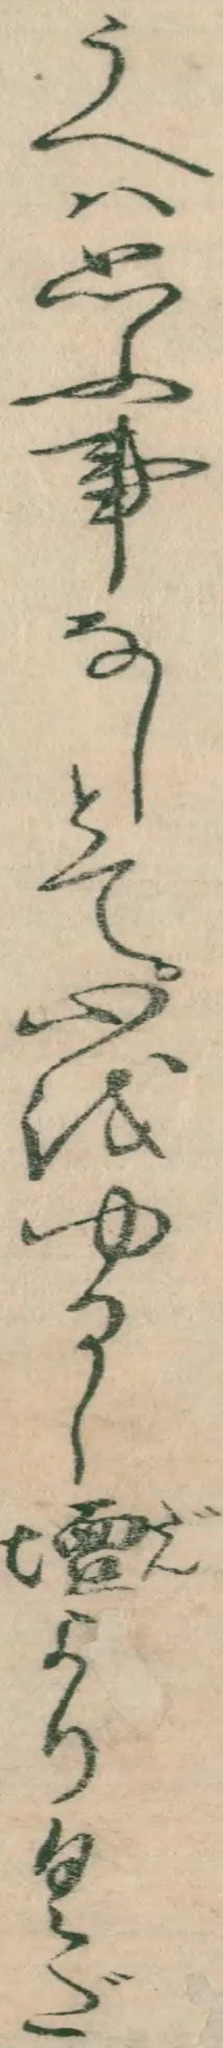うへは思ふ事なしとて。心をゆるし壇よりくだ
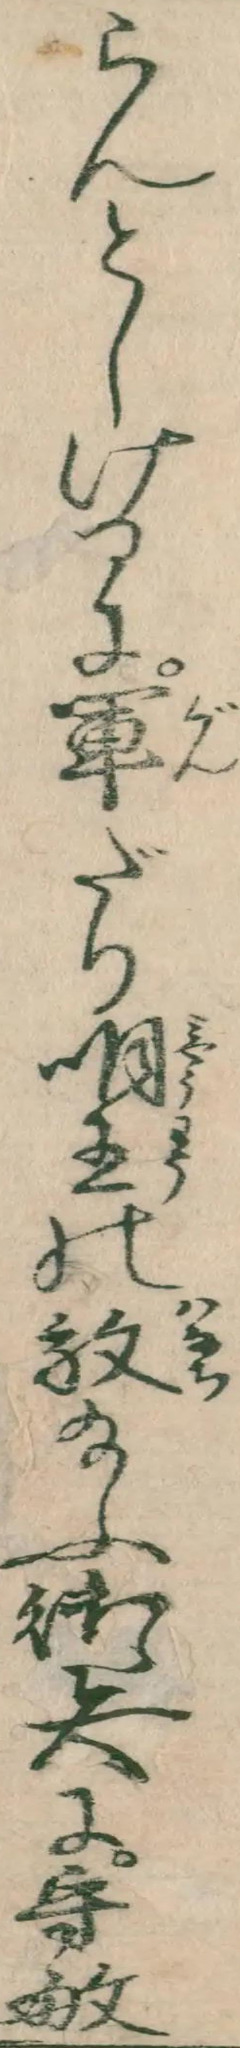らんとしけるに。軍だり明王の放給ふ御矢に。守敏
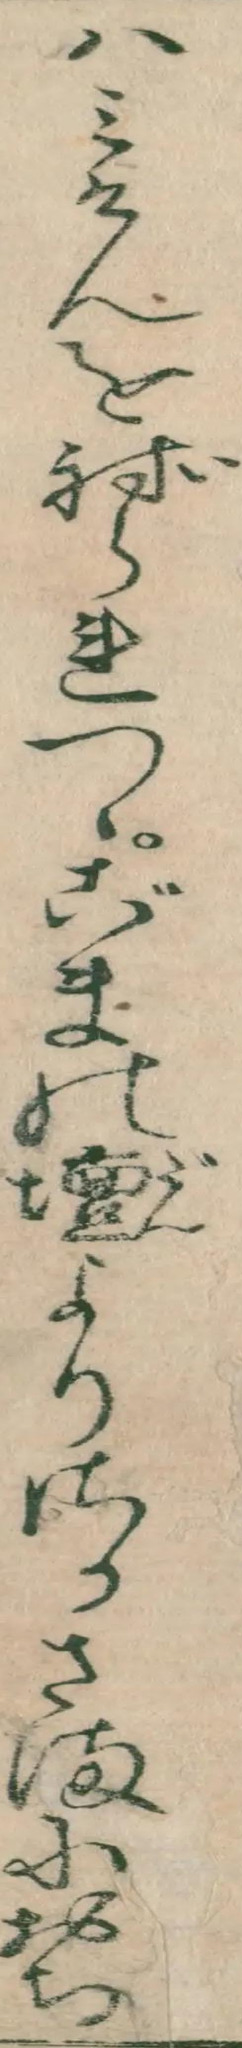はみけんを射られつゝ。ごまの壇よりさかさまにおち
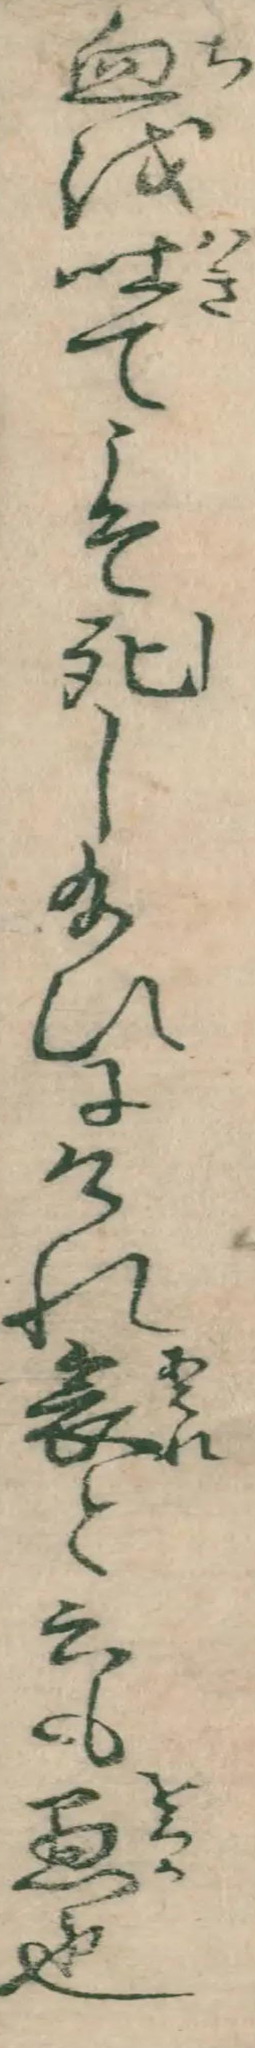血を吐てこそ死したまひにけれ哀と云も愚也

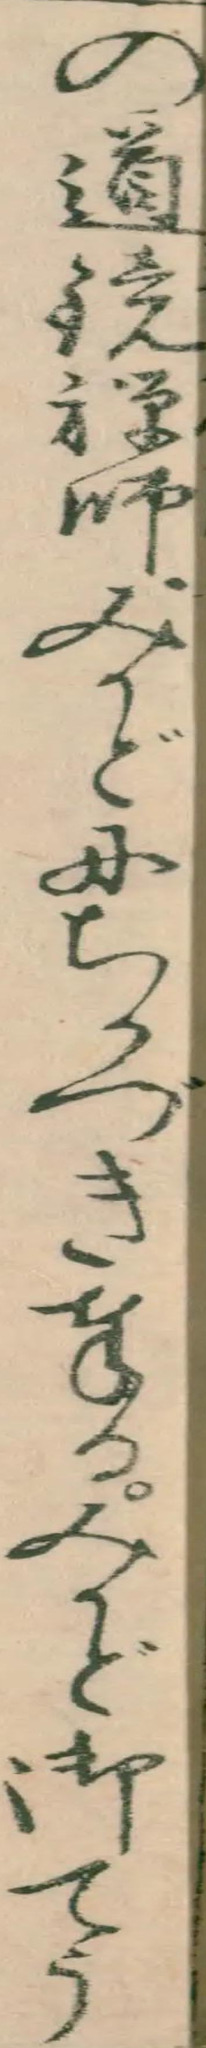の道鏡禅師みかどにちかづき奉る。みかど御てう
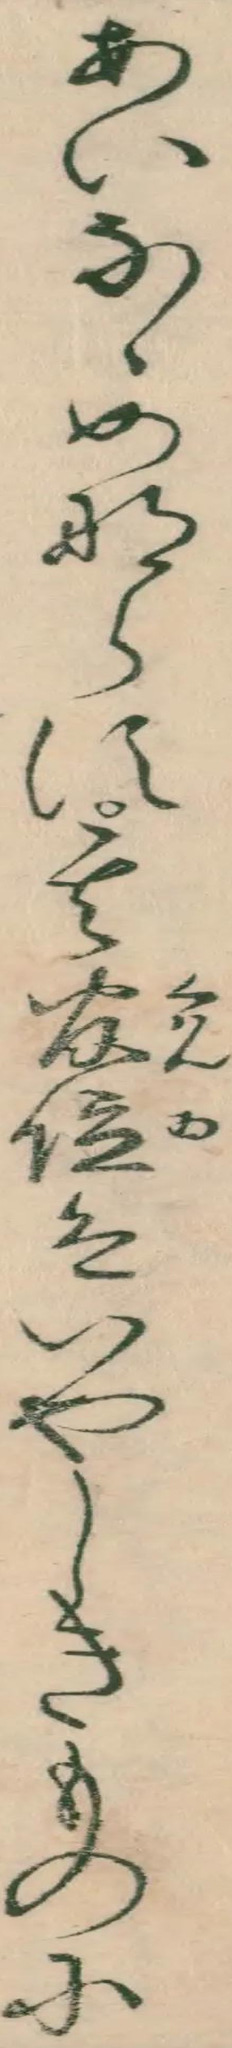あいなゝめならす。其官位はいやしきものに
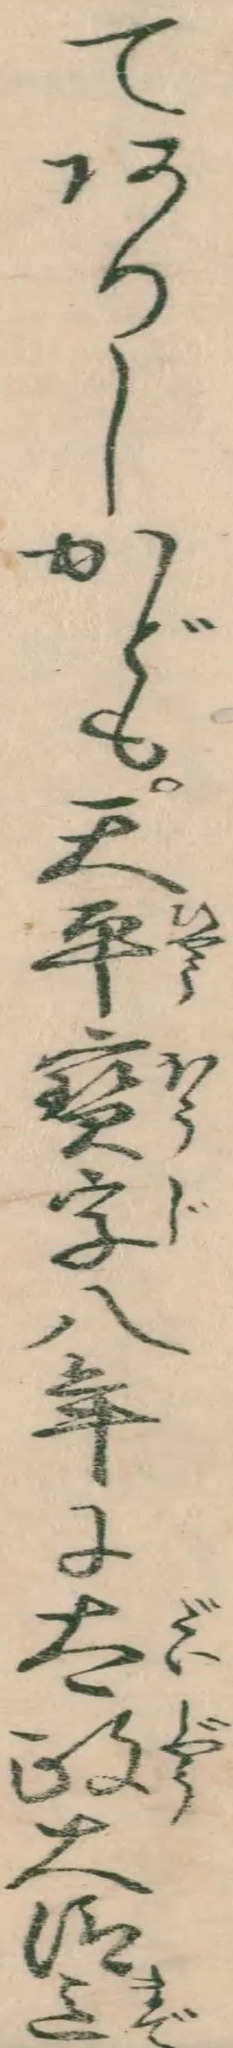てありしかども。天平宝字八年に太政大臣迄
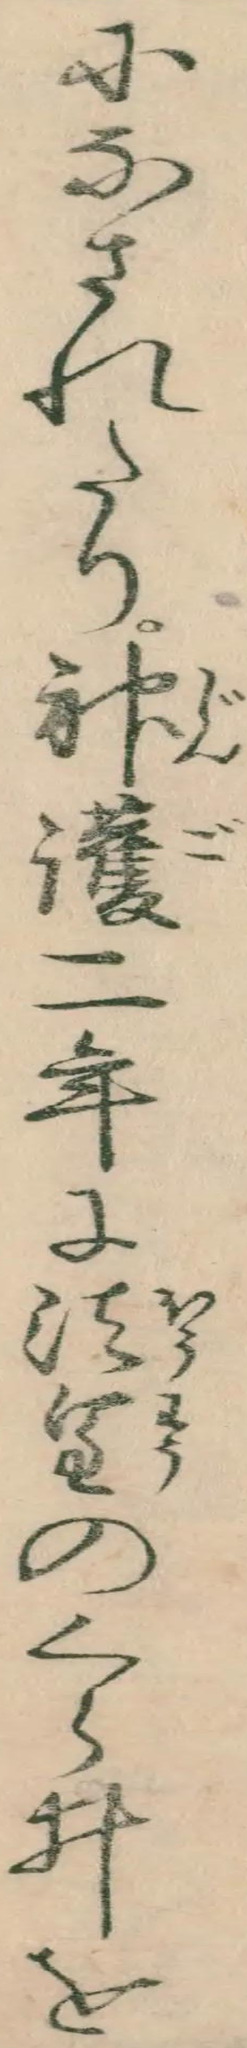になされたり。神護二年に法皇のくらゐを
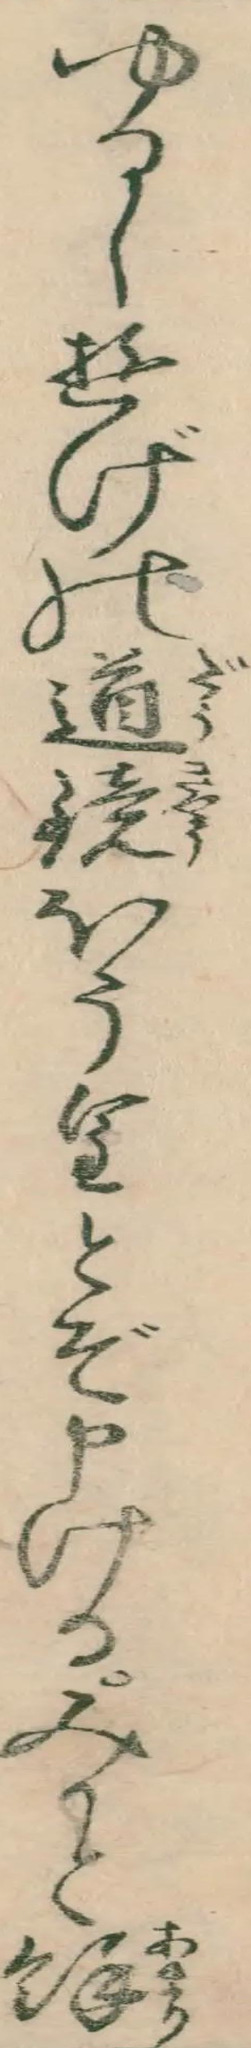ゆるしゆげの道鏡ほう皇と申ける。みかど余
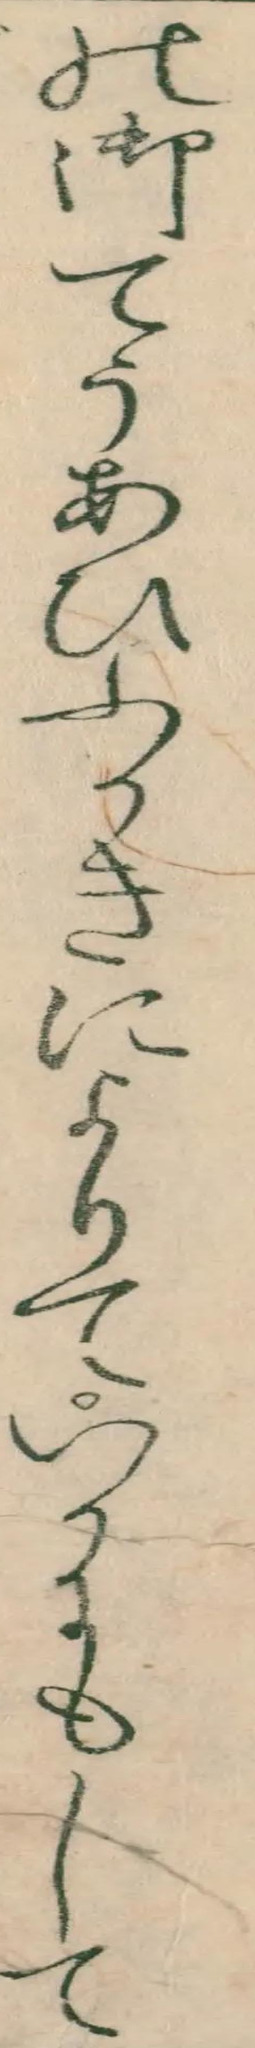の御てうあひふかきによりて。いかにもして
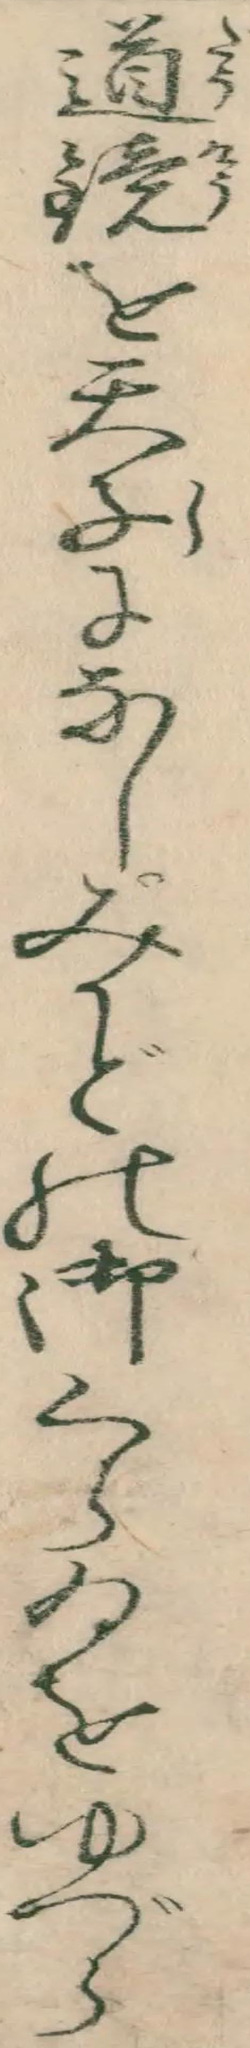道鏡を天子になし。みかどの御くらゐをゆずら
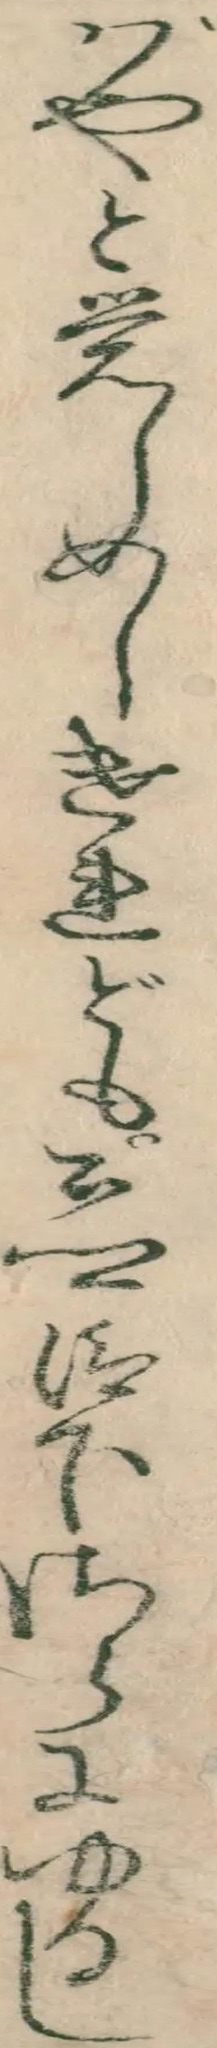ばやと覚しめしけれども。公卿臣下さらにゆるし
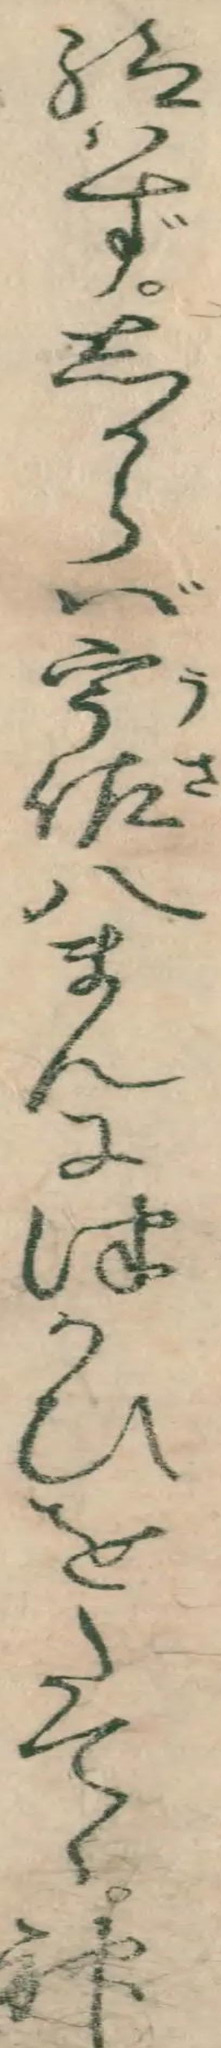給はず。しからば宇佐八まんにつかひをたてゝ。神
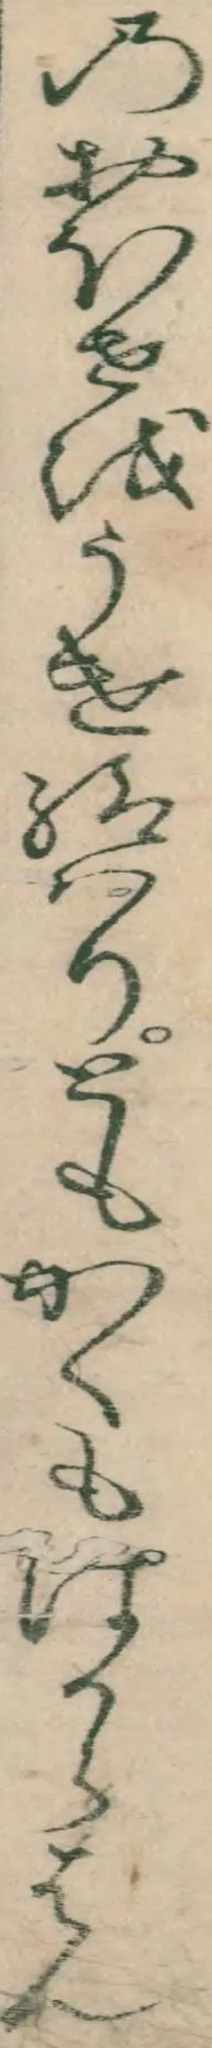のおほせをうけ給はり。ともかくもはからはん

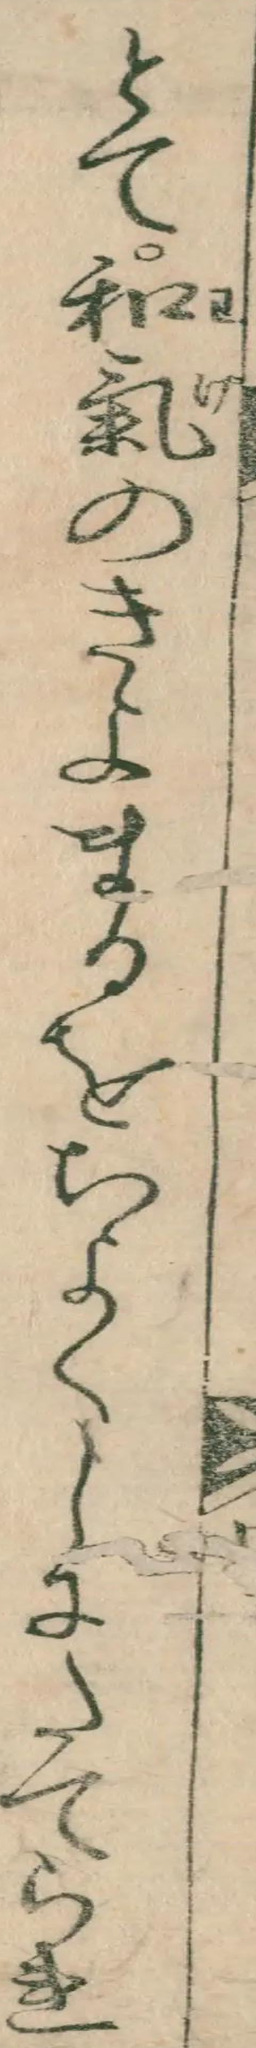とて。和気のきよまるをちよくしにたてられ
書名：弘法大師御本地 3巻. [3]
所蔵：国立国会図書館 National Diet Library, JAPAN
